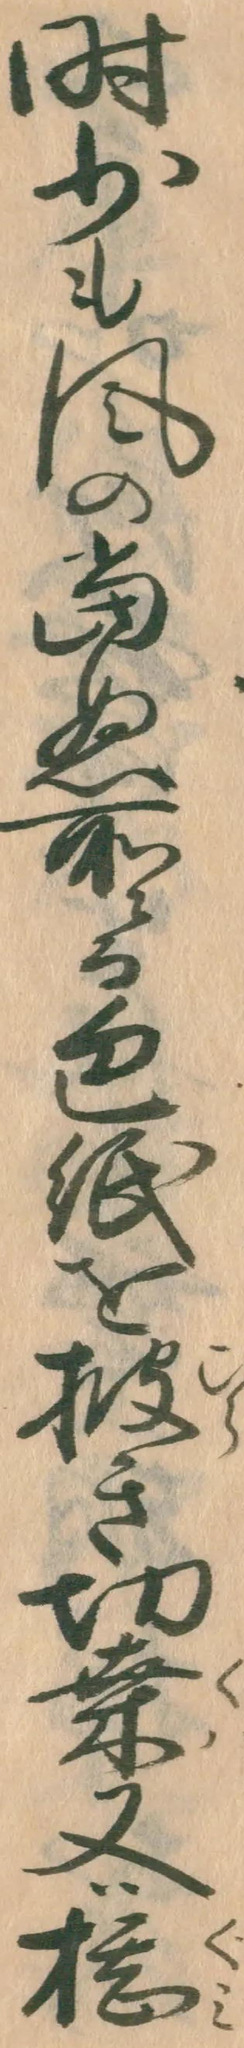時少も風の当ぬ所にて包紙を披き切桑又は椹
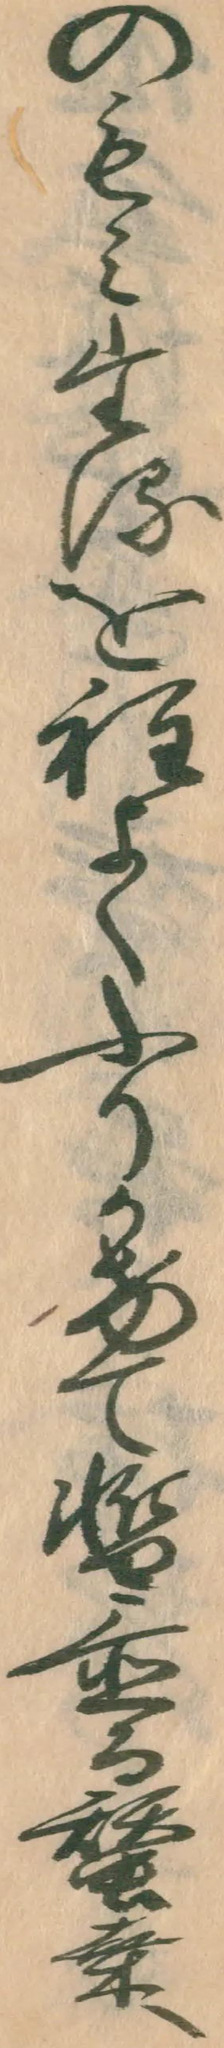のもみたるを程よくふりかけて暫置て蚕葉へ
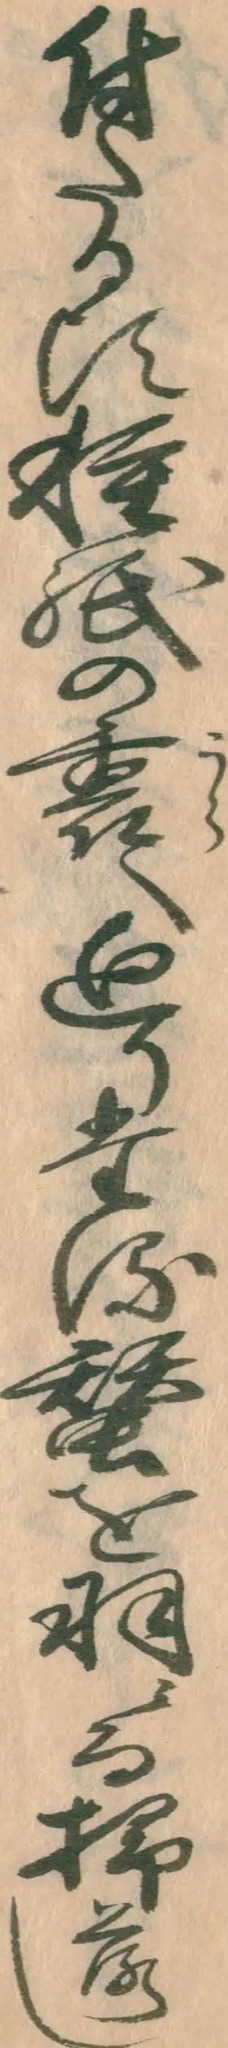付たる頃種紙の裏へ廻りたる蚕を羽にて掃落し
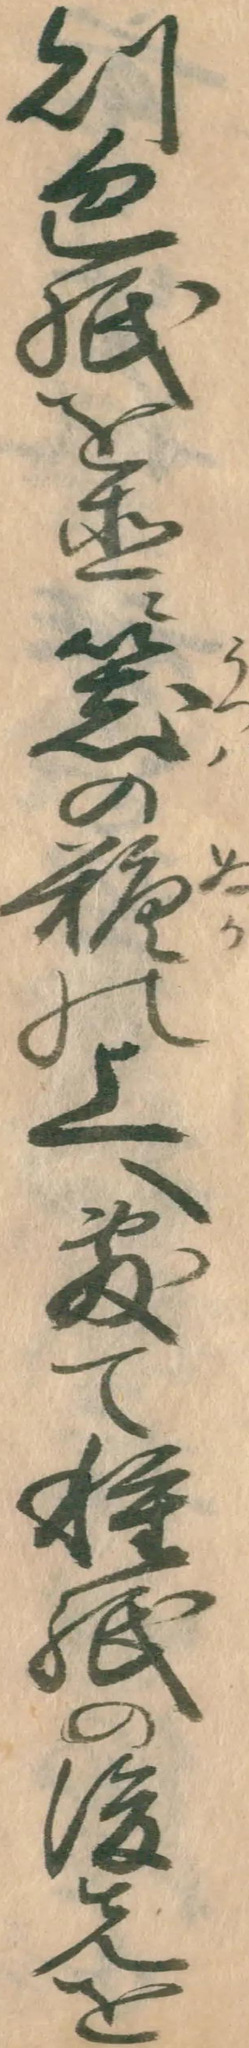則包紙を直に器の糖の上へ敷て種紙の後先を
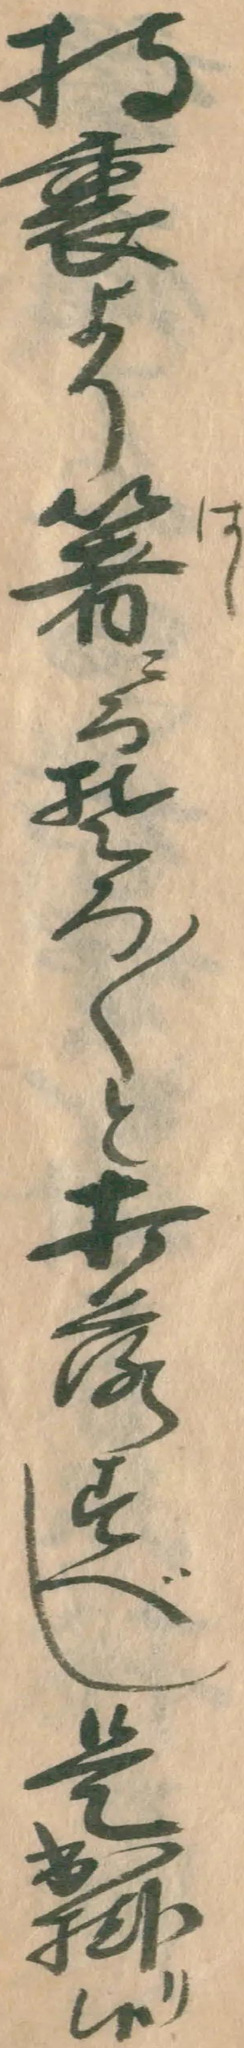持裏より箸にてそろ〳〵と打落すべし是出掛り候

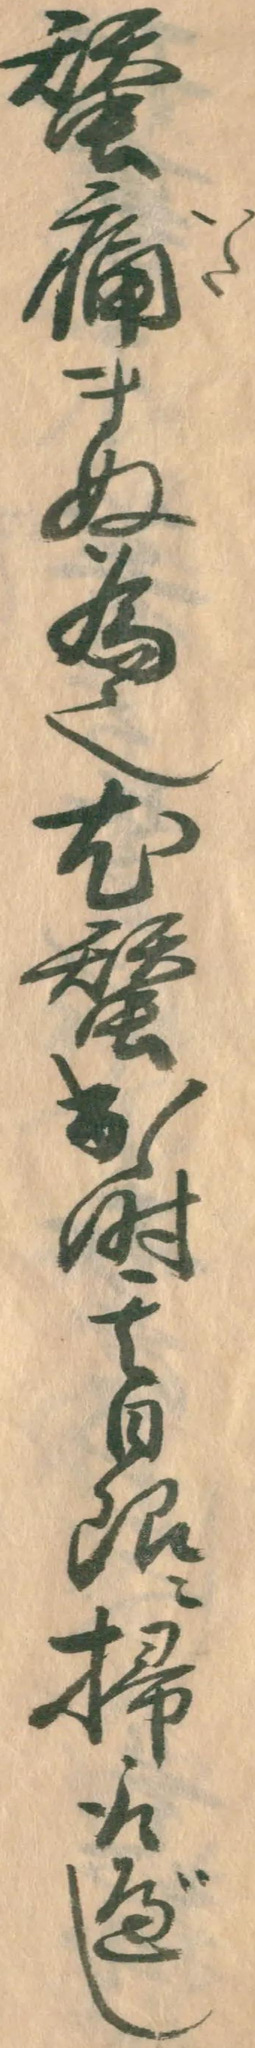蚕痛まぬ為也尤蚕出候時其日限に掃取べし
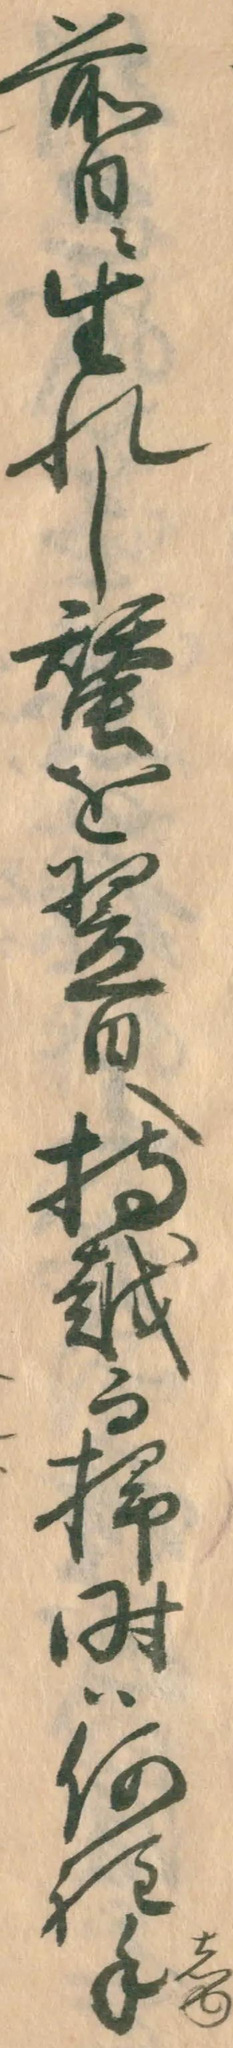前日に生れし蚕を翌日へ持越て掃時は何程手
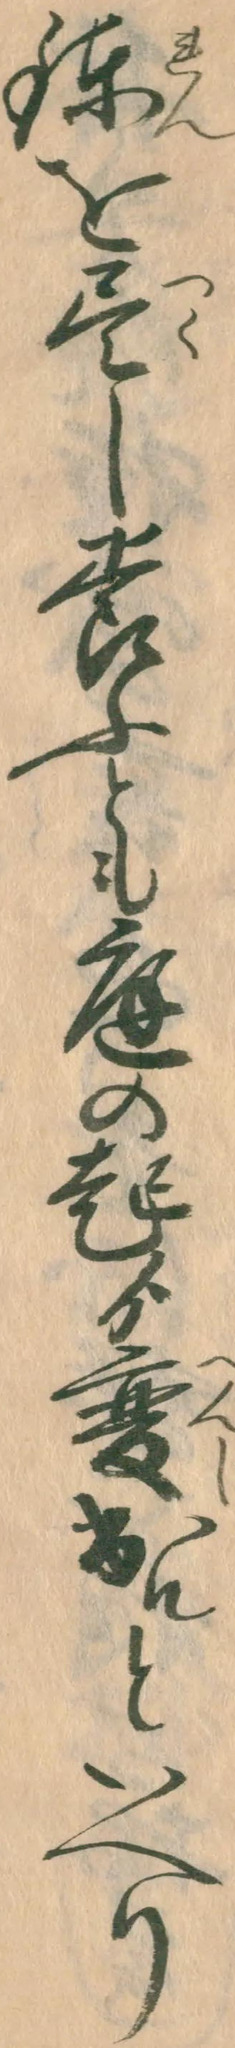練を尽し養ふとも庭の起ゟ変出るといへり
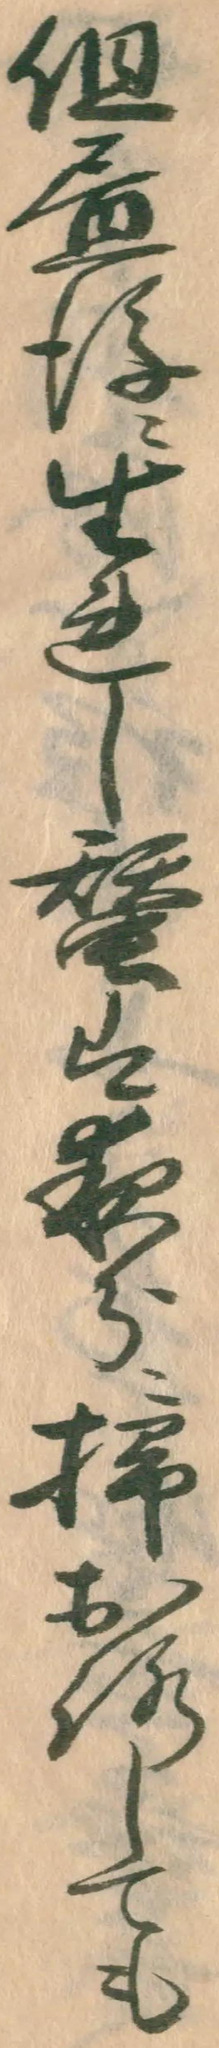但昼後に生れし蚕は夜分に掃おろしても
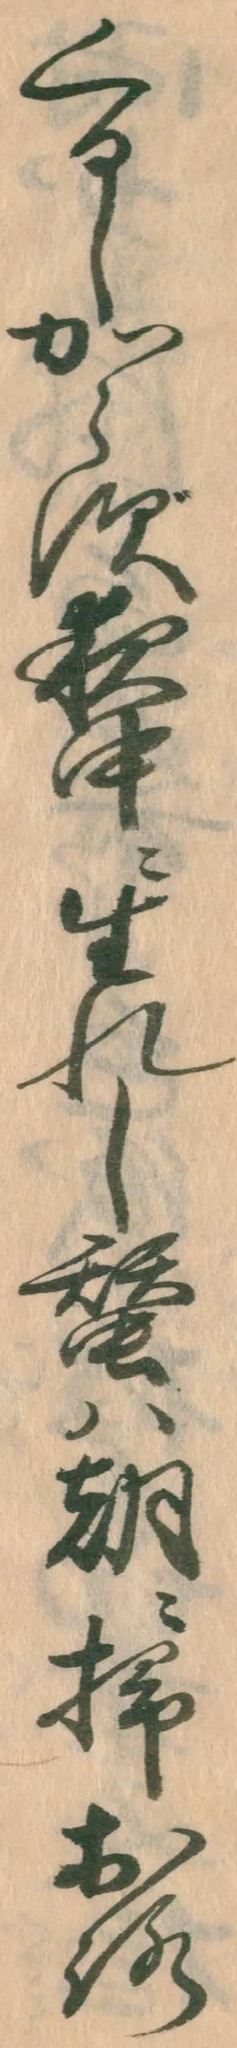くるしからず夜中に生れし蚕は朝に掃おろ
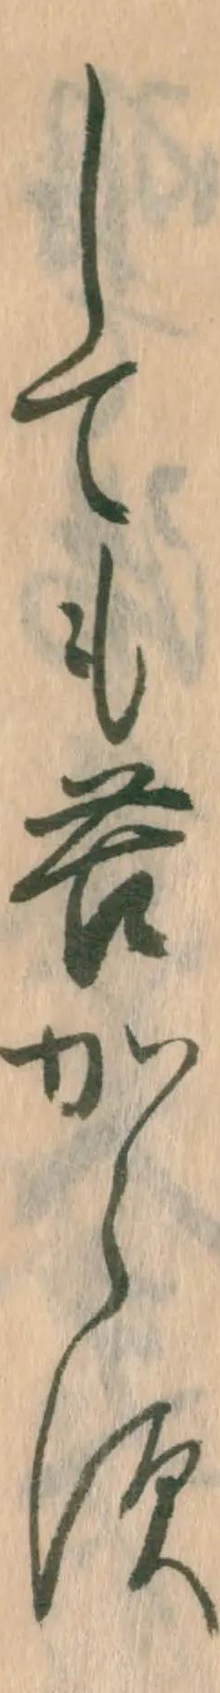しても苦からす
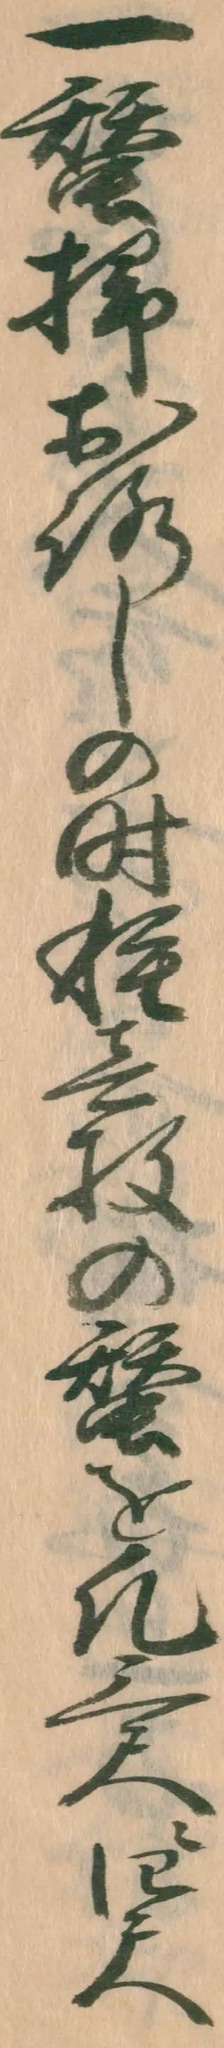一蚕掃おろしの時種壱枚の蚕を凡三尺に四尺
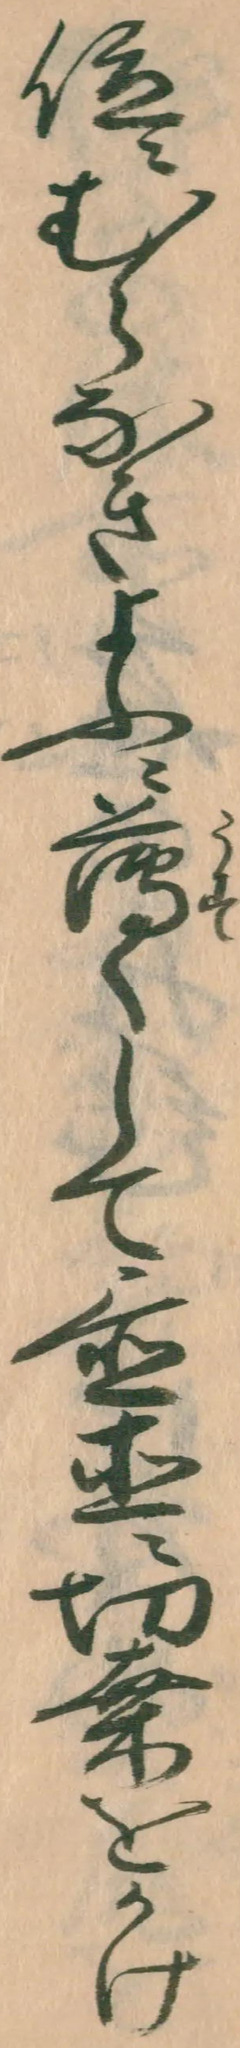位にむらなきよふに薄くして置直に切桑をかけ
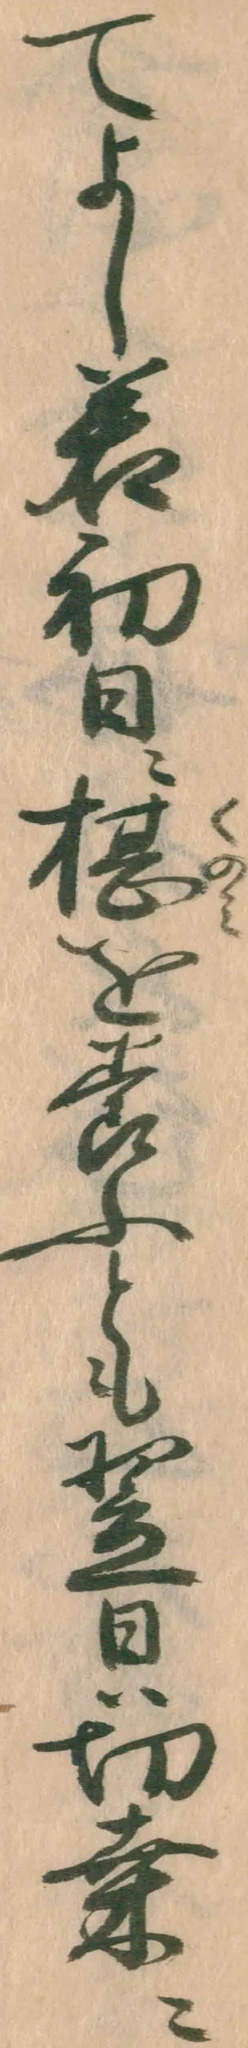てよし若初日に椹を養ふとも翌日は切桑に
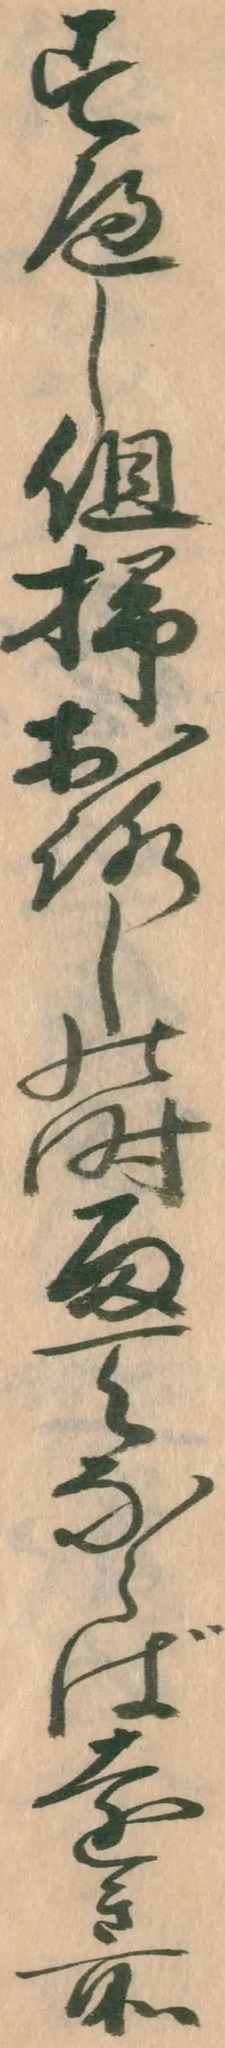すへし但掃おろしの時雨天ならば遠き所
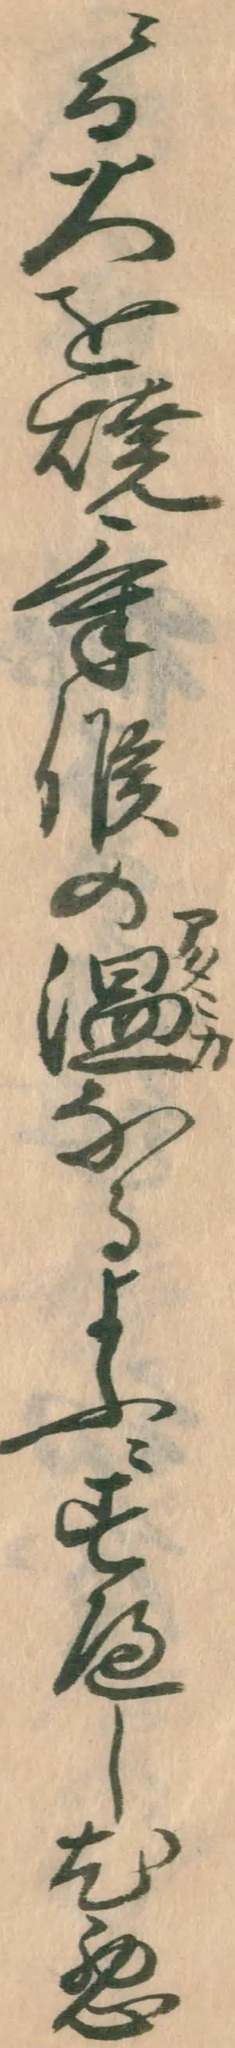にて火を焼気候の温なるよふにすへし尤
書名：養蚕録
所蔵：国立国会図書館 National Diet Library, JAPAN
